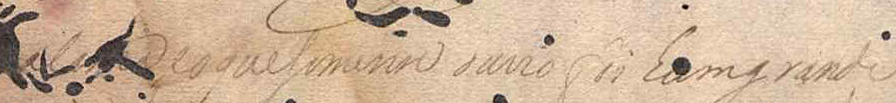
a Cama, e o que somente ouvio foi hum grande
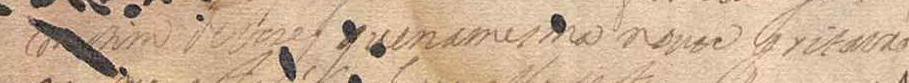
c_tim de vezes que na mesma noute gritavaõ
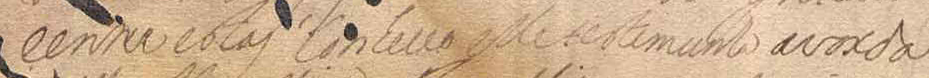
e entre estas Conheceo elle testemunha a vox da
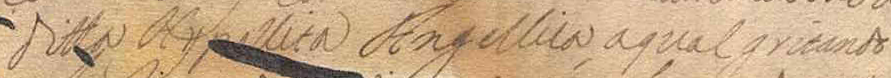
ditta Hypollita Angellica, a qual gritando
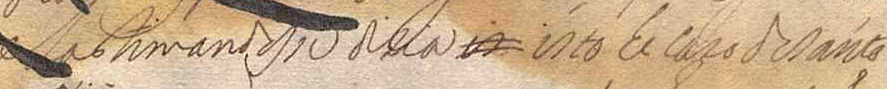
e lastimandosse dizia is isto he cazo de santo
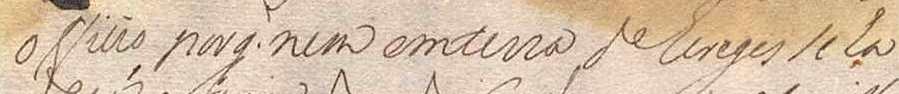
officio porq̄. nem em terra de hereges se ha
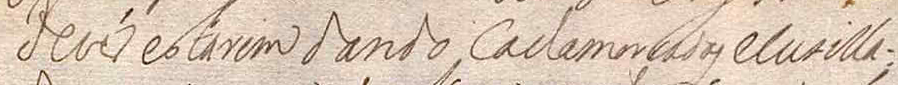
de ver estarem dando Cachamorradas e Cutilla
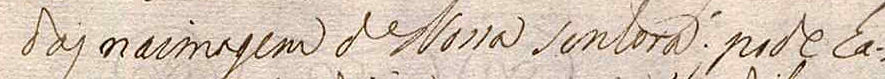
das na imagem de Nossa senhora; pode ha
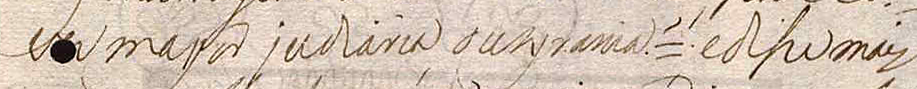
ver mayor judiaria, ou tyrania. = e disse mais
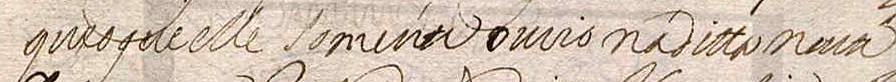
que o que elle somente ouvio na ditta noute
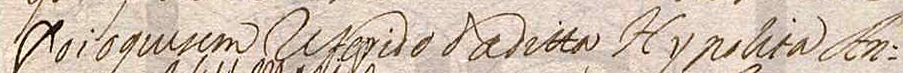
foi o que tem Referido da ditta Hypolita An
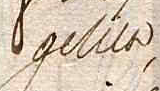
gelica,
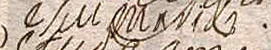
e seu marido.
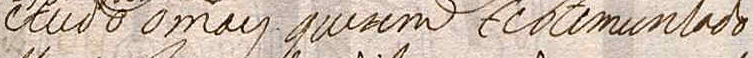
e tudo o mais que tem testemunhado
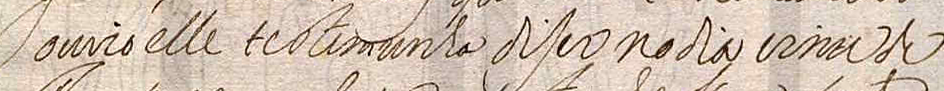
ouvio elle testemunha diser no dia vinte de
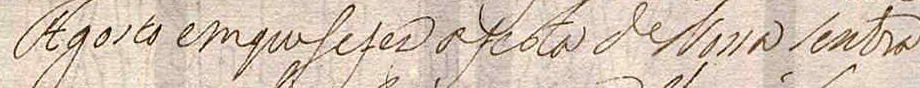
Agosto em que se fez a festa de Nossa senhora
